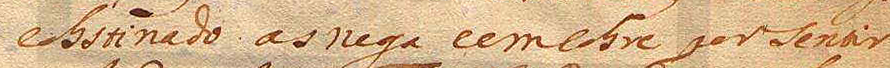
e obstinado as nega e emcobre por sentir
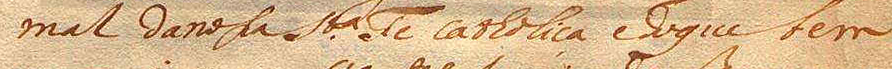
mal da nossa s.ta Fe catholica e do que tem
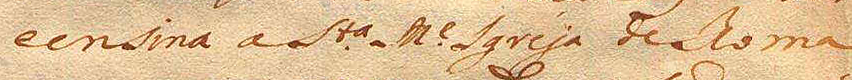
e ensina a St.a M.e Igreja de Roma
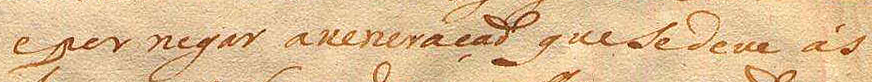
e por negar a ueneraçaõ que se deue ás
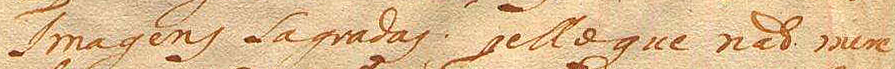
Imagens sagradas; pello que naõ mere
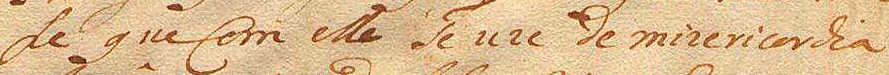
se que Com elle se uze de mizericordia
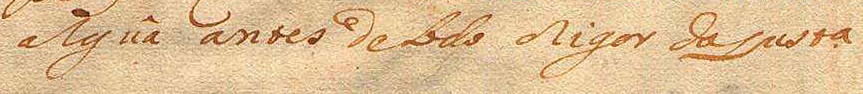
alguā antes de todo o Rigor da just.a
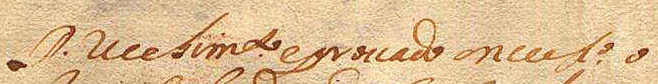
P. Recebim.to e prouado o necess.o o
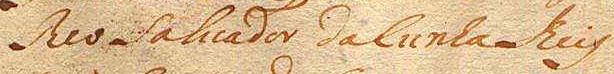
Reo Saluador da Cunha Reis
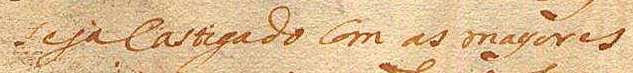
seja castigado com as mayores
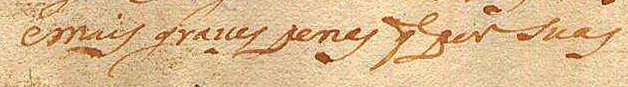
e mais graues penas q̄ por suas
